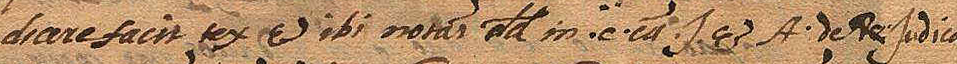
dicere facit tex et ibi notar̄ đđ in .c. īa. J et A. de Re Judica
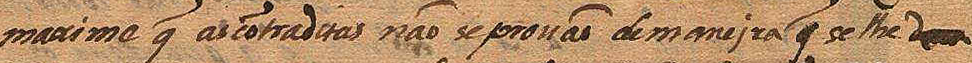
maxime q̄ as c̄otraditas não se prouão de manejra q̄ se lhe deu
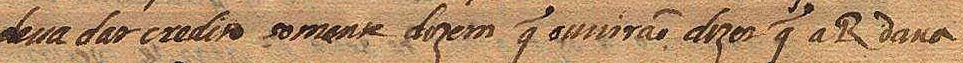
deua dar credito somente dizem q̄ ouuirão dizer q̄ a R daua
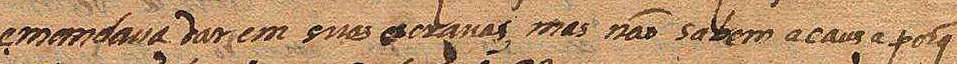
e mandaua dar em suas escrauas mas não sabem a causa porq̄
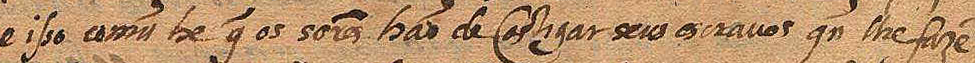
e isso comū he q̄ os sor̄es hão de Castigar seus escrauos q̄n lhe fazē
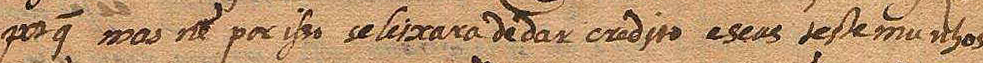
por q̄ mas nē por isso se leixara de dar credito a seus testemunhos
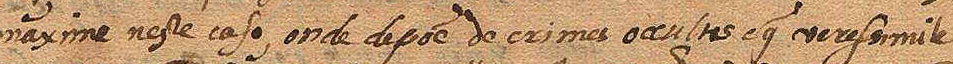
maxime neste caso, onde depoẽ de crimes occultos e q̄ veressimile
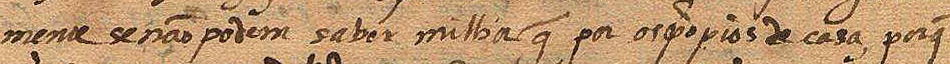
mente se não podem saber milhor q̄ por os p̄opios de casa, porq̄
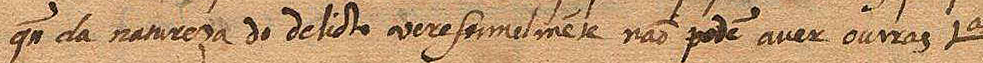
q̄n da natureza do delicto veressimelmēte não podē auer outras tas
